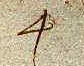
4
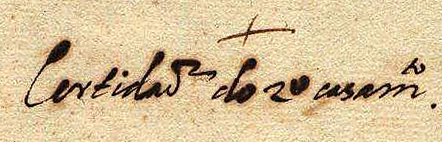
Certidaõ do 2o casamto.
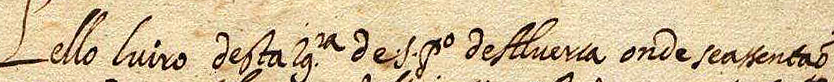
Pello liuro desta Igra de S. Po de Aluerca onde se assentaõ
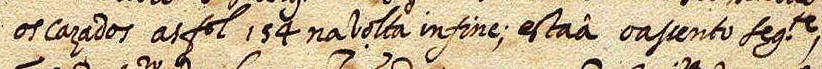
os cazados as fol 154 na volta in fine; estaá o assento seg.te
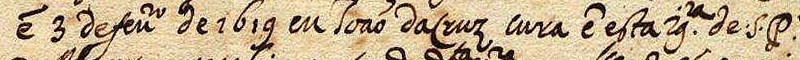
ē 3 de feuro de 1619 eu Ioaõ da Cruz cura ē esta ig.ra de .S. P.o
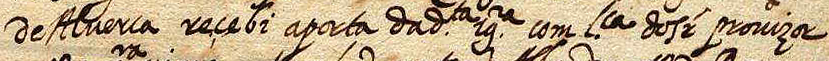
de Aluerca recebi a porta da d.ta ig.ra com l.ça do sr̄ prouizor
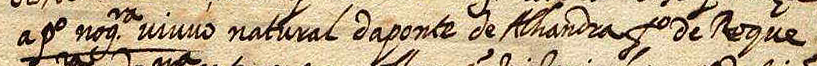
a po nog.ra uiuuo natural da ponte de Alhandra fo de Roque
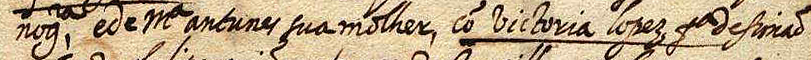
nogra, e de ma antunes sua molher, cō victoria lopez fa de simaõ
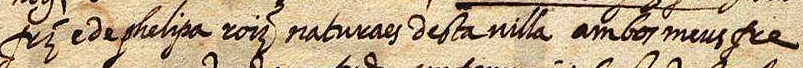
frz̄ e de phelipa roiz̄ naturaes desta uilla ambos meus fre
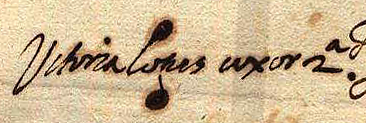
Vitoria lopes uxor 2a.
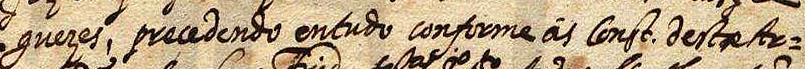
guezes, precedendo en tudo conforme ás const. deste Ar
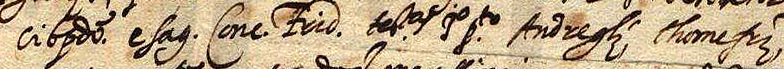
cibpdō. e sag. Conc. Trid. test.as Io p.to Andre glz̄, thome frz̄,
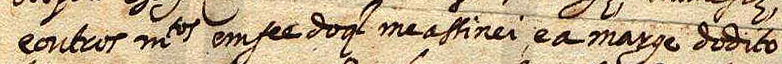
e outros mtos em fee do q̄ me assinei, e a marge do dito
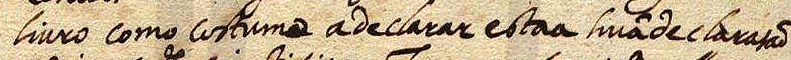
liuro como costume a declarar estaa huā declarasaõ
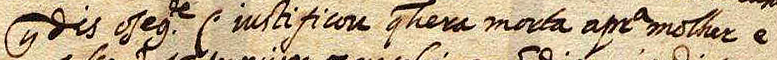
q̄ dis o seg.te /. iustificou q̄ hera morta a pra molher e
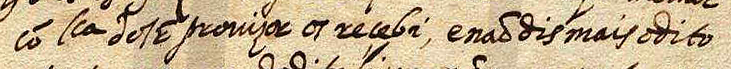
cō lça dese prouizor os recebi, e naõ dis mais o dito
